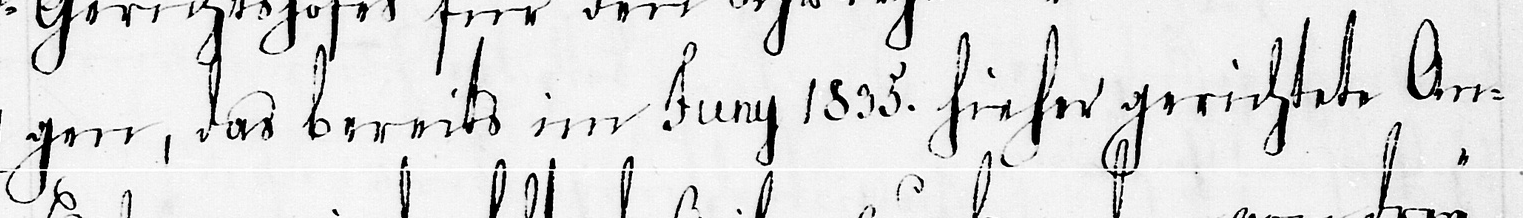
gen, das bereits im Juny 1835. hieher gerichtete An¬
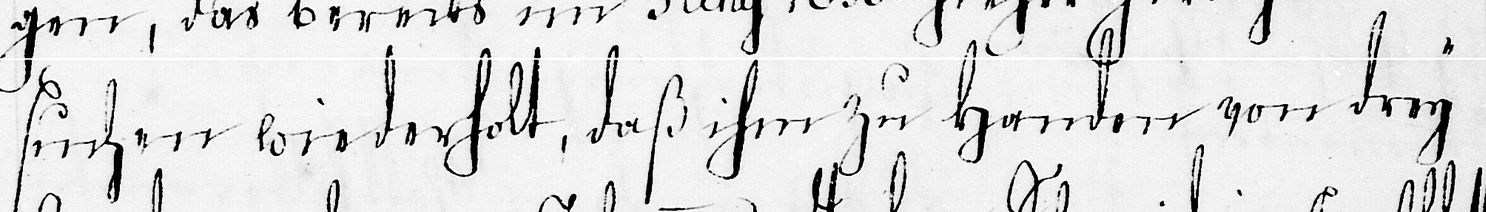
suchen wiederholt, daß ihm zu Handen von drey
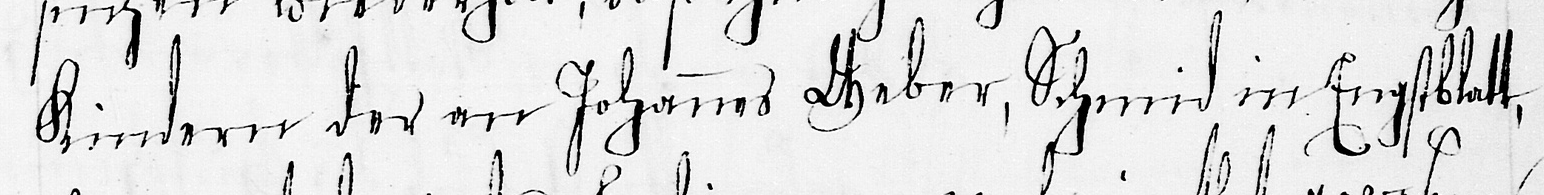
Kindern der an Johannes Weber, Schmid in Engstblat¬
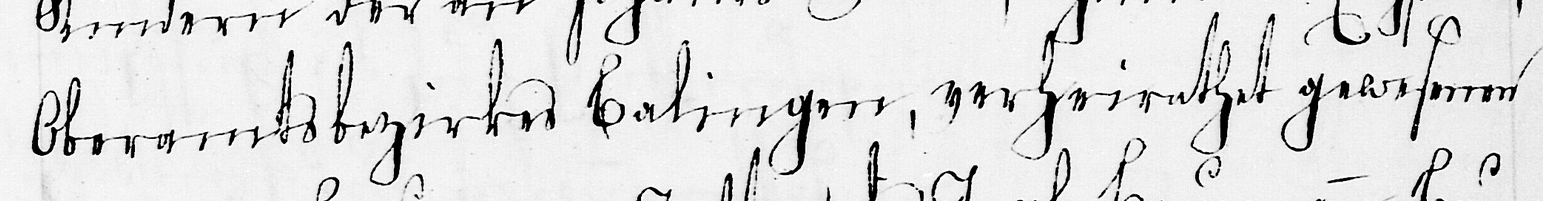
Oberamtsbezirkes Balingen, verheirathet gewesenen
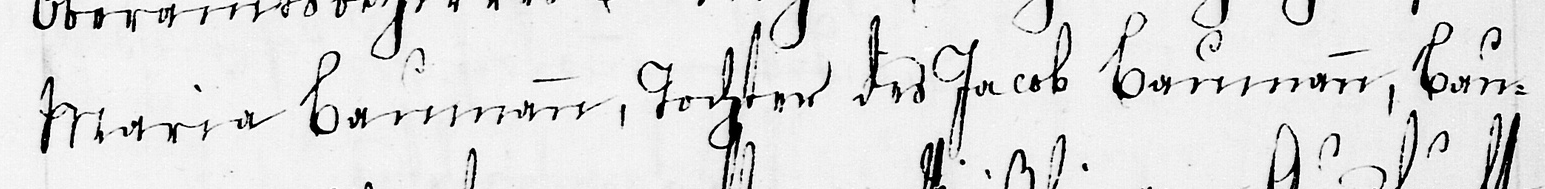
Maria Baumann, Tochter des Jacob Baumann, Bau¬
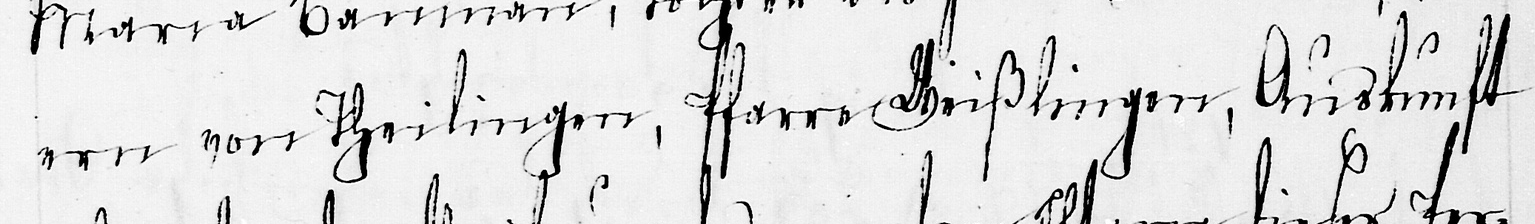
ern von Theilingen, Pfarre Weißlingen, Auskunft
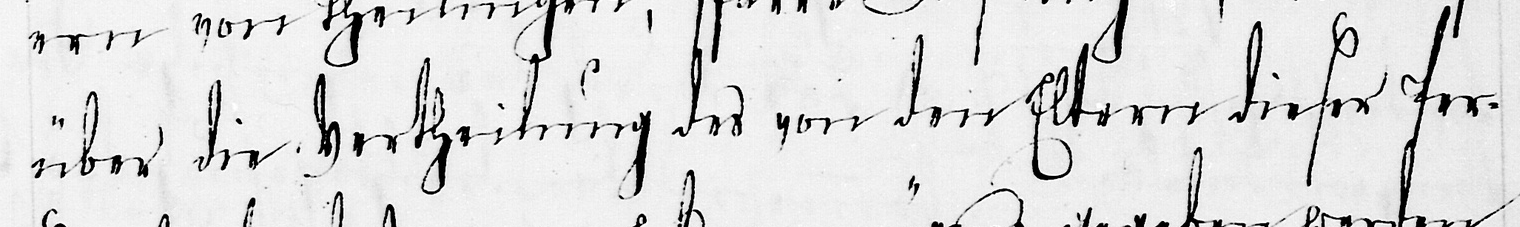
über die Vertheilung des von den Eltern dieser Per¬
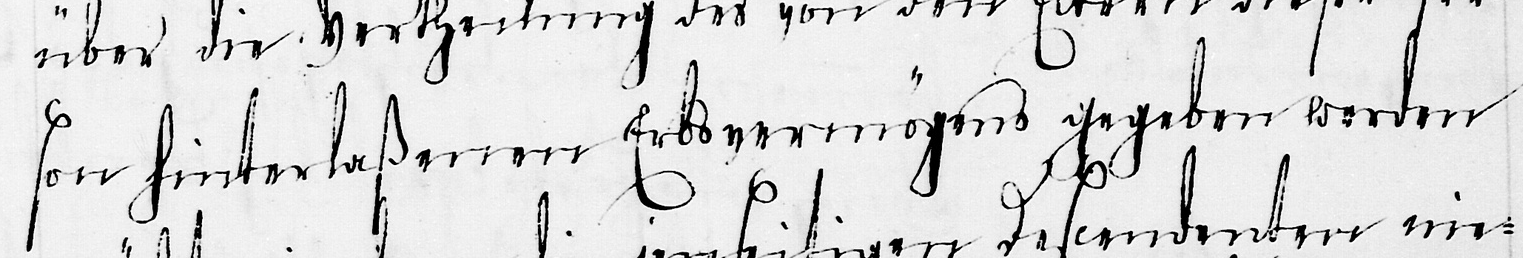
son hinterlaßenen Erbsvermögens gegeben werden
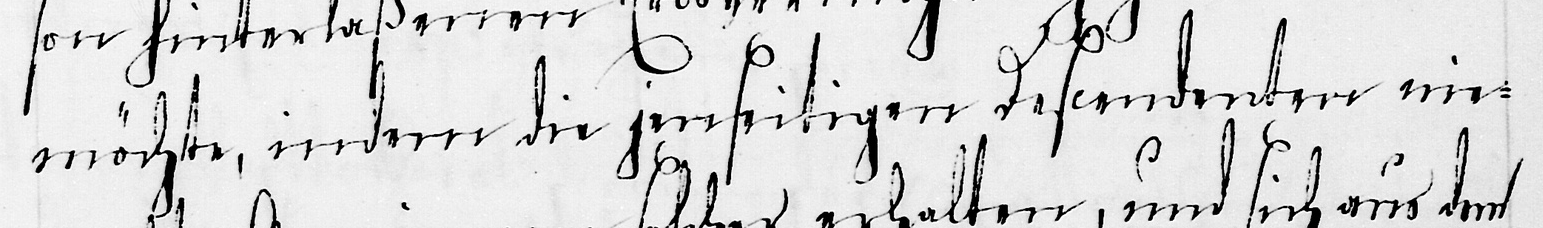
möchte, indem die jenseitigen Descendenten nie¬
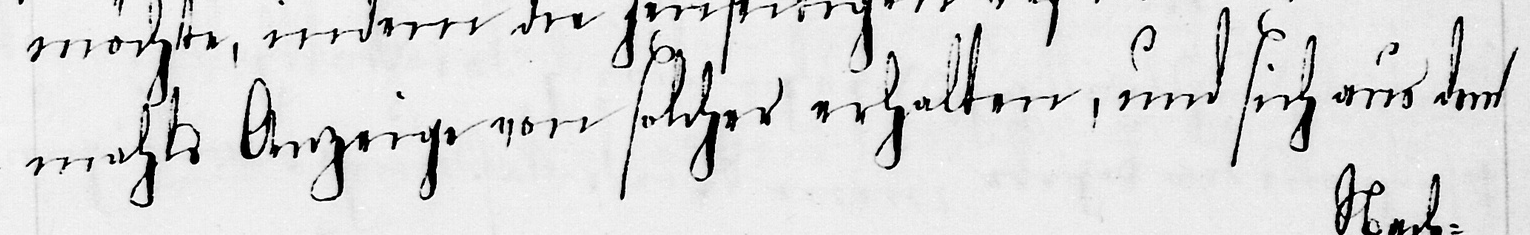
mahls Anzeige von solcher erhalten, und sich aus dem
